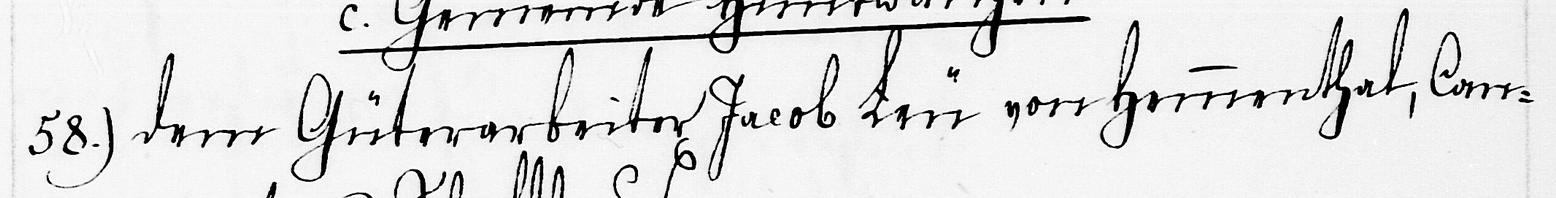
58.) dem Güterarbeiter Jacob Leu von Hemmenthal, Can¬
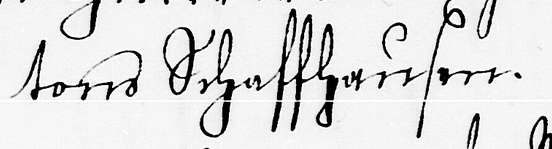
tons Schaffhausen.
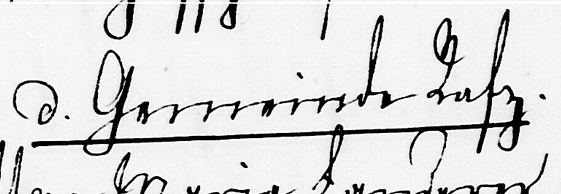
d. Gemeinde Rafz.
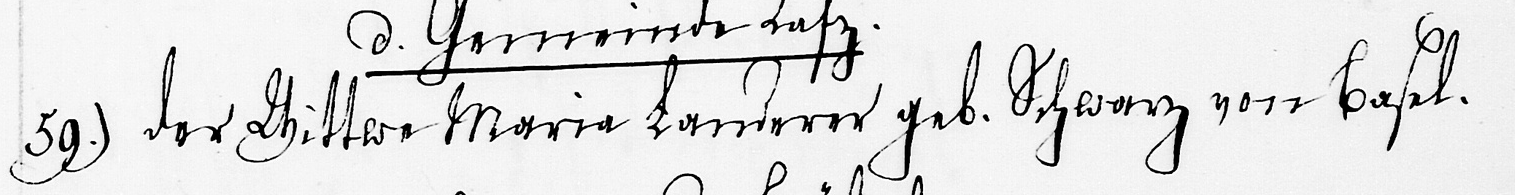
59.) der Wittwe Maria Landerer geb. Schwarz von Basel.
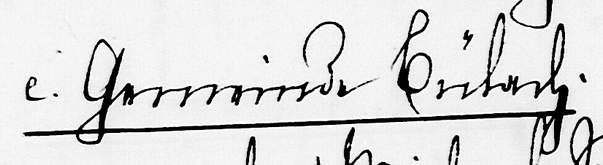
e. Gemeinde Bülach.
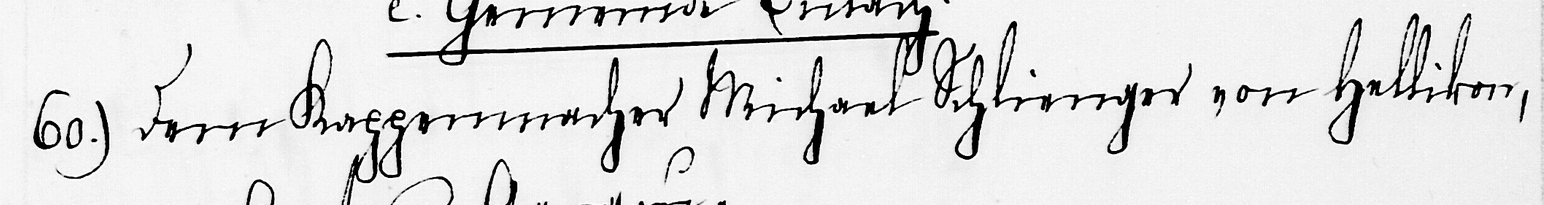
60.) Dem Kappenmacher Michael Schlienger von Hellikon,
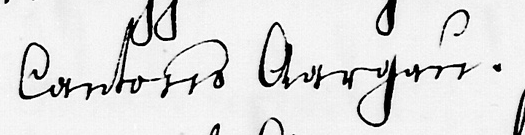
Cantons Aargau.
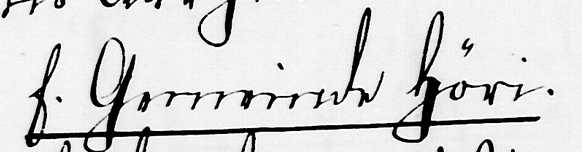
f. Gemeinde Höri.
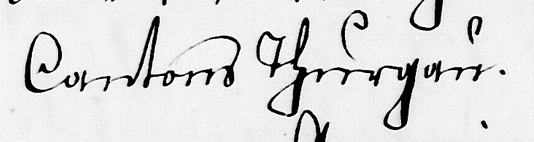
Cantons Thurgau.
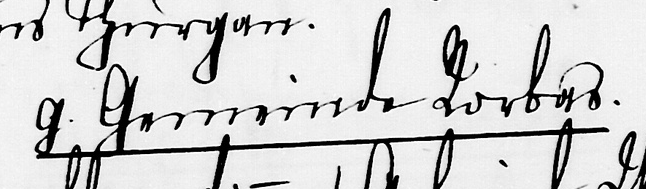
g. Gemeinde Rorbas.
